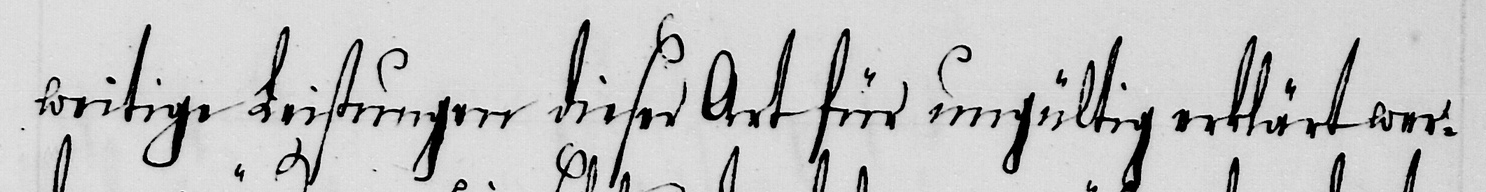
weitige Leistungen dieser Art für ungültig erklärt wer¬
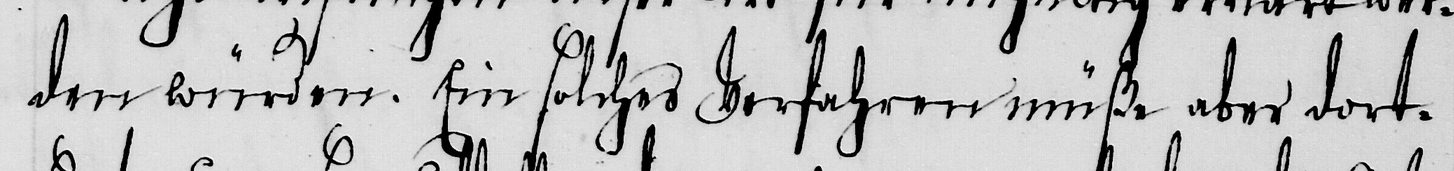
den würden. Ein solches Verfahren müße aber dort¬
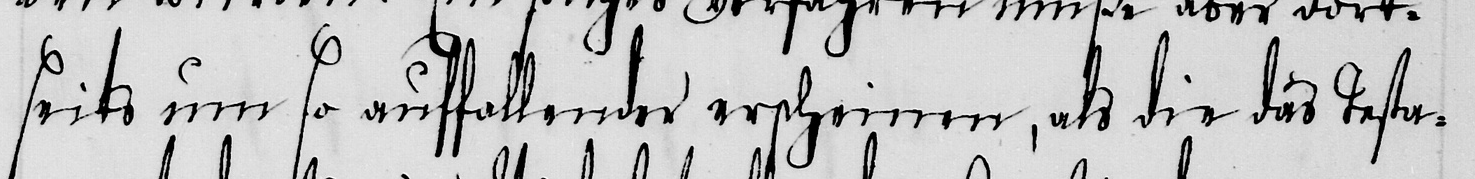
seits um so auffallender erscheinen, als die das Testa¬
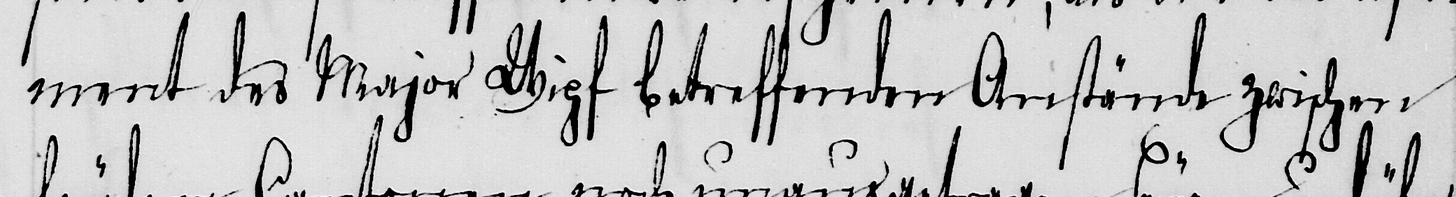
ment des Major Wipf betreffenden Anstände zwischen
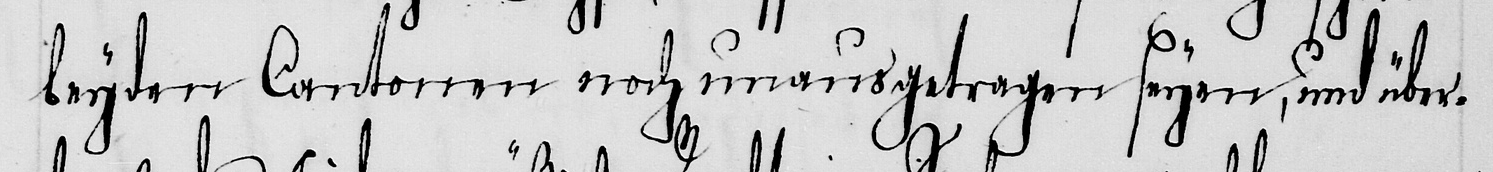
beyden Cantonen noch unausgetragen seyen, und über¬
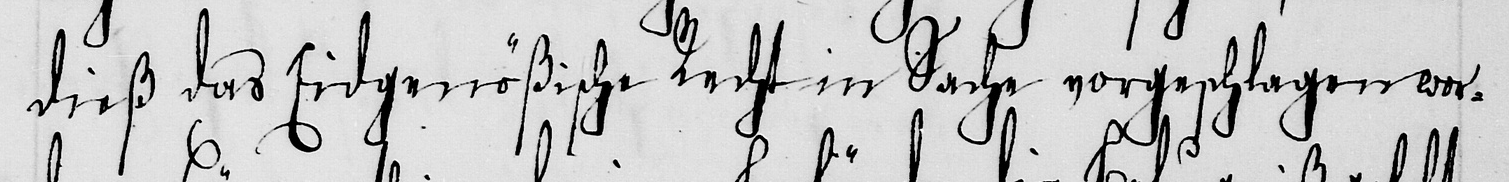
dieß das Eidgenößische Recht in Sache vorgeschlagen wor¬
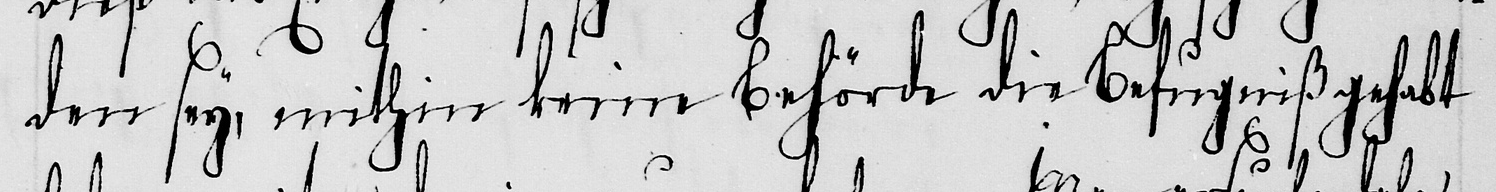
den sey, mithin keine Behörde die Befugniß gehabt
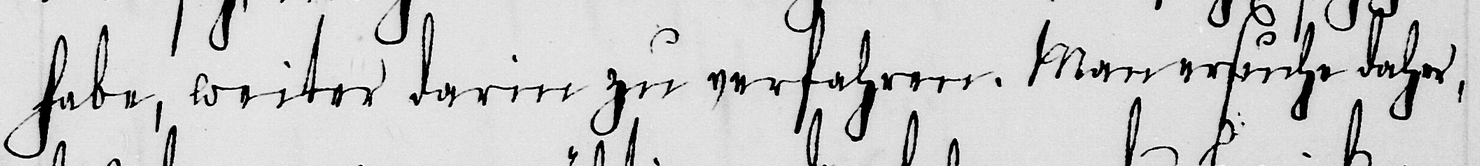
habe, weiter darin zu verfahren. Man ersuche daher,
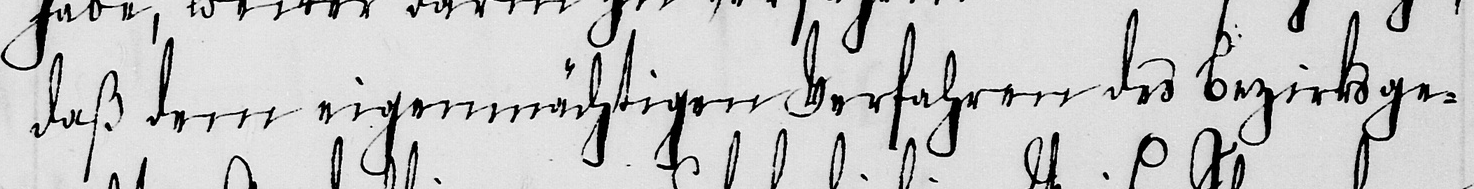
daß dem eigenmächtigen Verfahren des Bezirksge¬
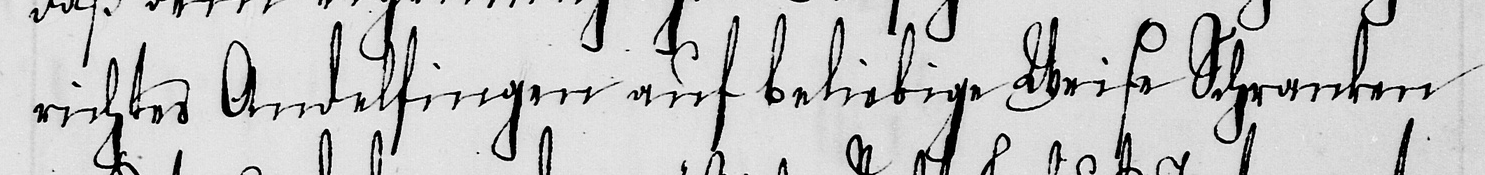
richtes Andelfingen auf beliebige Weise Schranken
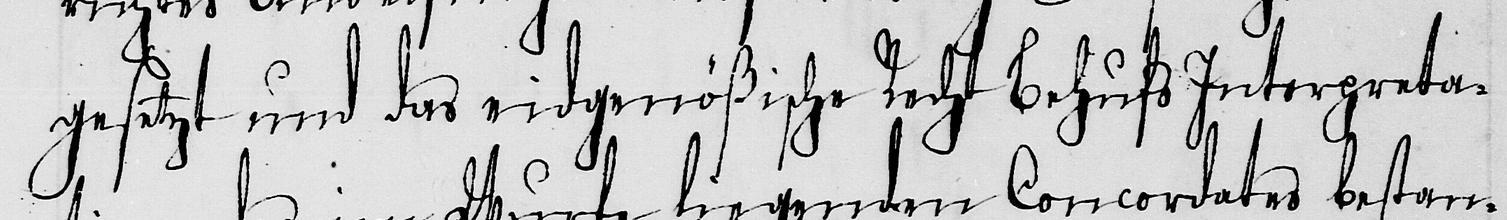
gesetzt und das eidgenößische Recht Behufs Interpreta¬
